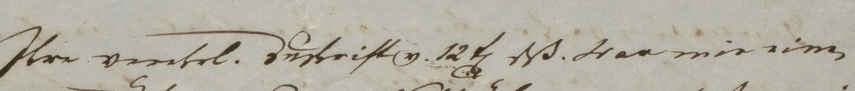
Ihre verehrl. Zuschrift v. 12ten dß. war mir eine
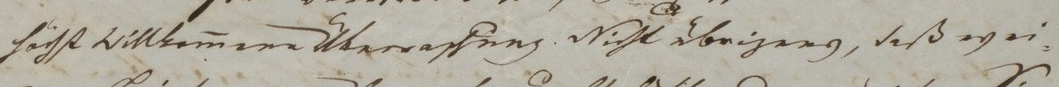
höchst willkommene Überraschung. Nicht übrigens, daß es ei-
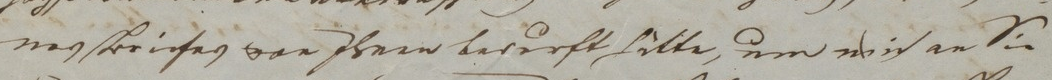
nes Briefes von Ihnen bedurft hätte, um mich an Sie
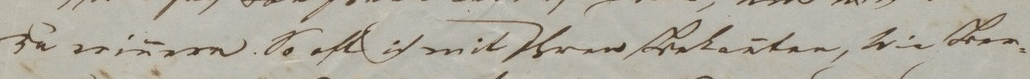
zu erinnern. So oft ich mit Ihren Bekannten, wie Ber-
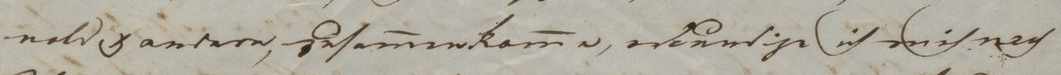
nold & andern, zusammenkomme, erkundige ich mich nach
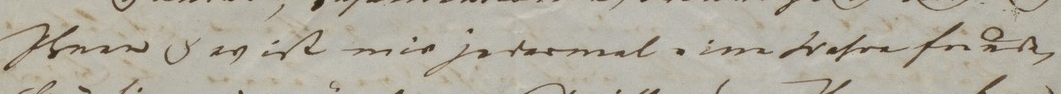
Ihnen & es ist mir jedesmal eine wahre Freude,
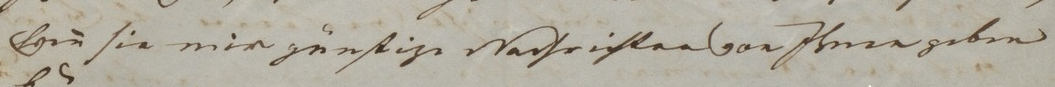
wenn sie mir günstige Nachrichten von Ihnen geben
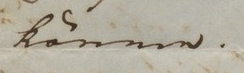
können.
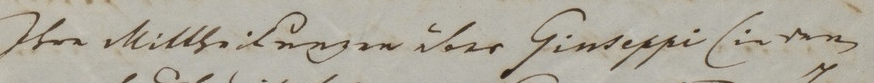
Ihre Mittheilungen über Giuseppi (in den
